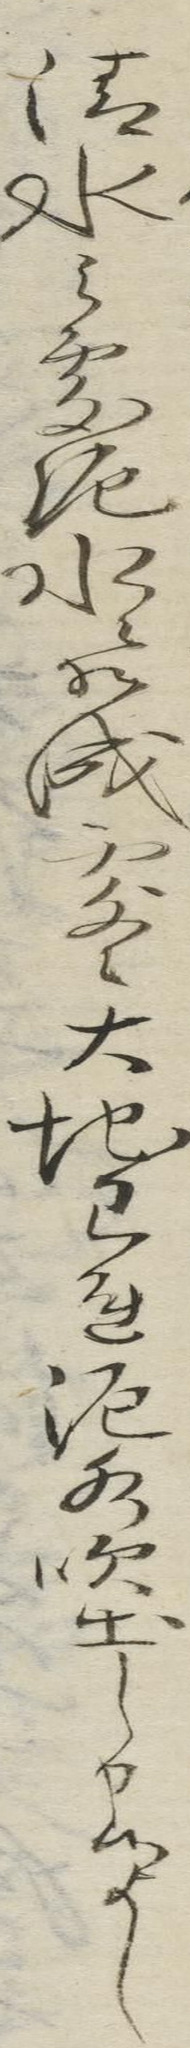清水之処泥水ニ相成処〻大地われ泥水吹出し申候よし
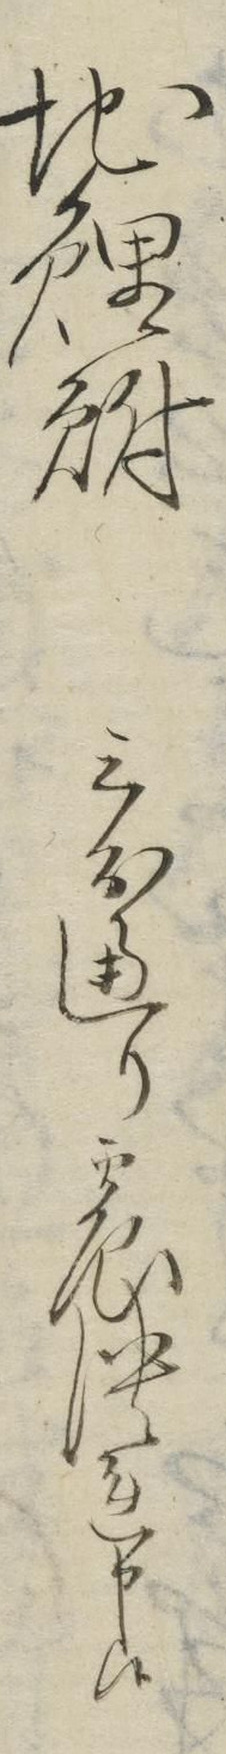池鯉鮒三分通り震潰れ申候
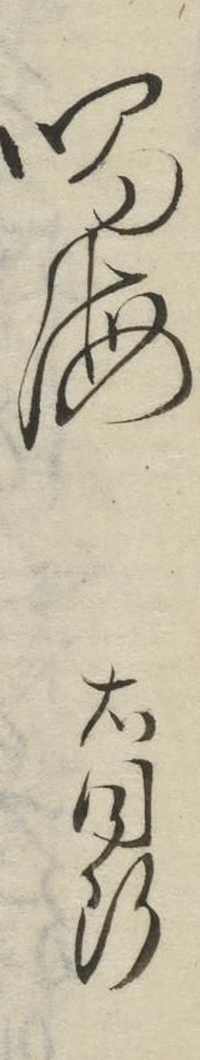鳴海右同断
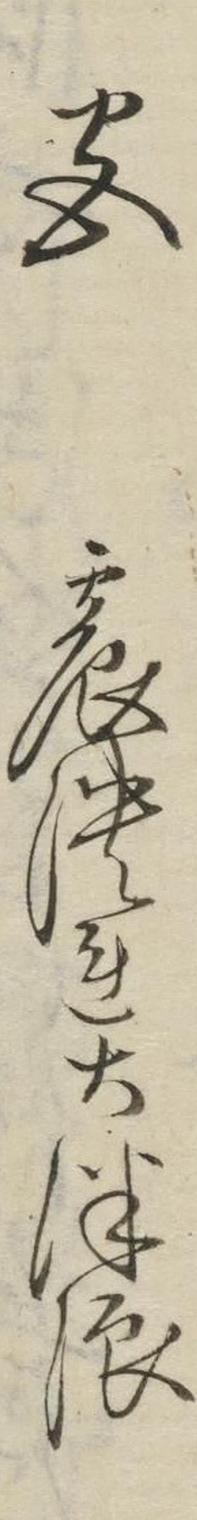宮震潰れ大津浪
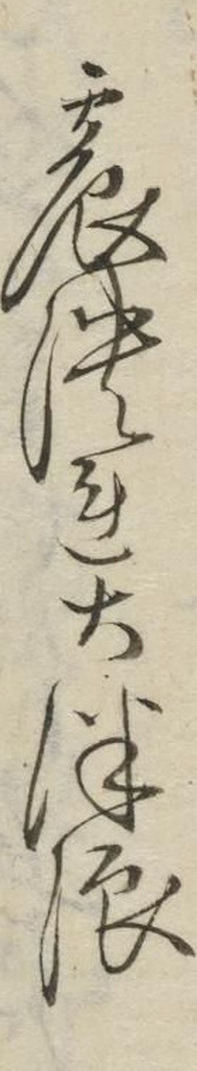宮震潰れ大津浪
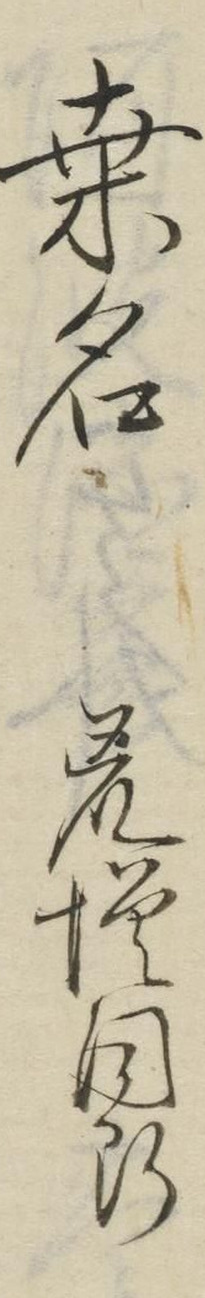桑名荒増同断
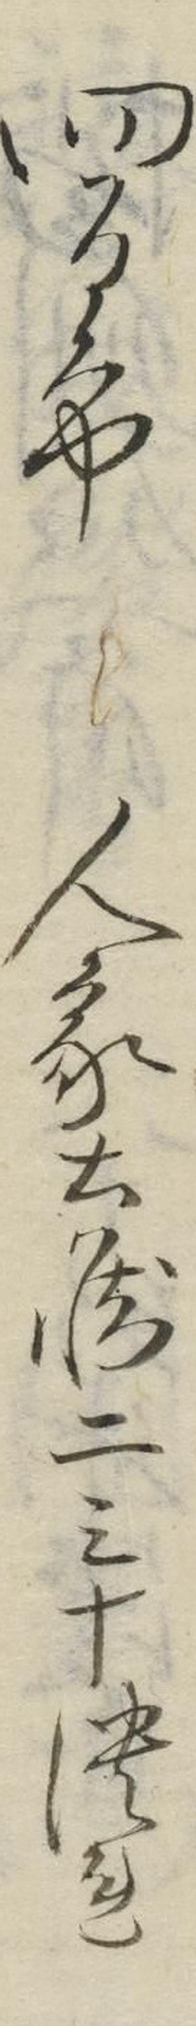四日市人家土蔵二三十潰れ
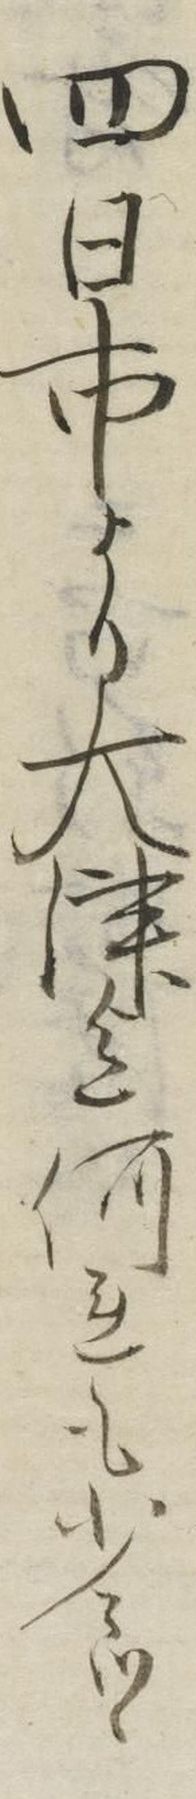四日市より大津迄何れも少〻ツヽ
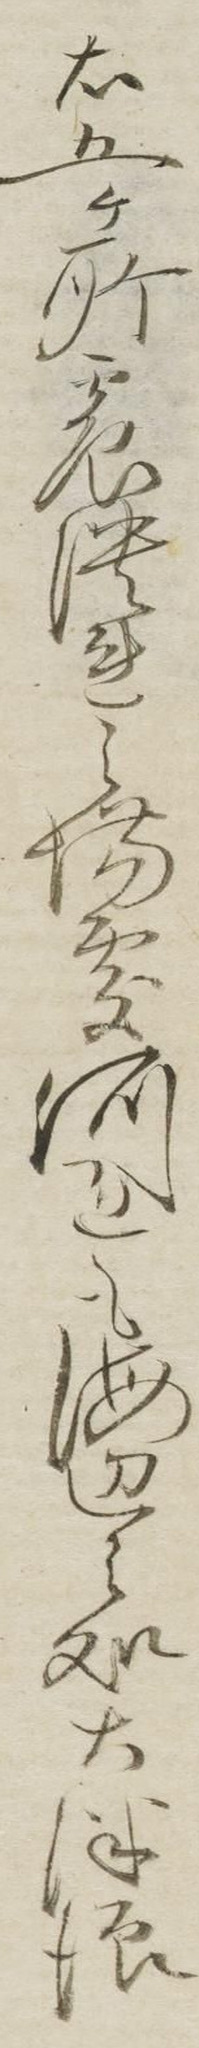津右五ケ所震潰れ之場所何れも海辺之処大津浪
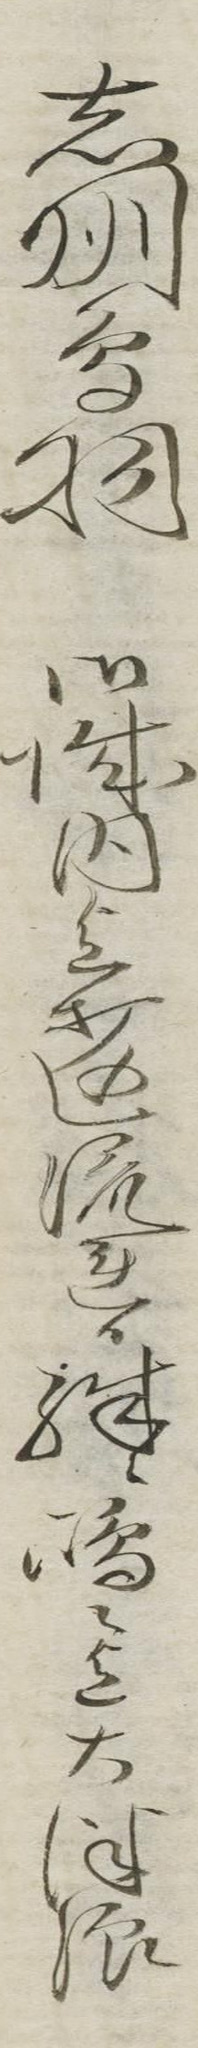志州鳥羽御城内迄打込流れ候殊ニ嶋ニ迄大津浪
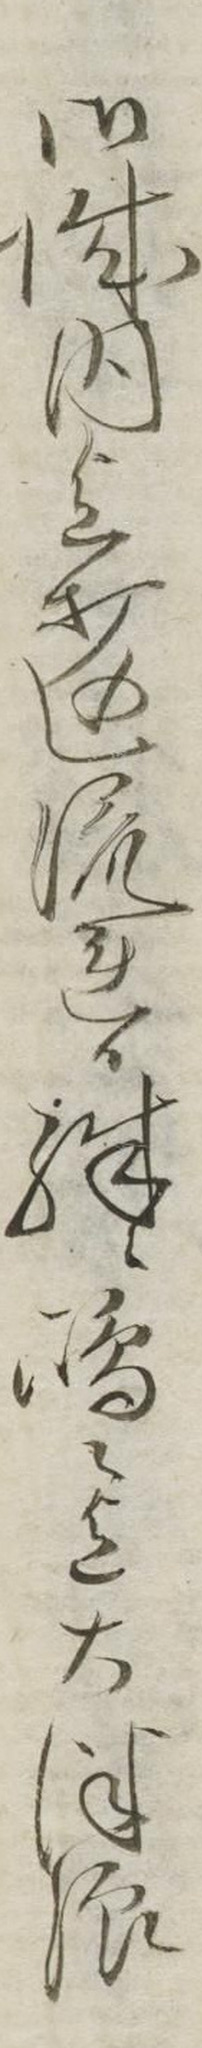志州鳥羽御城内迄打込流れ候殊ニ嶋ニ迄大津浪

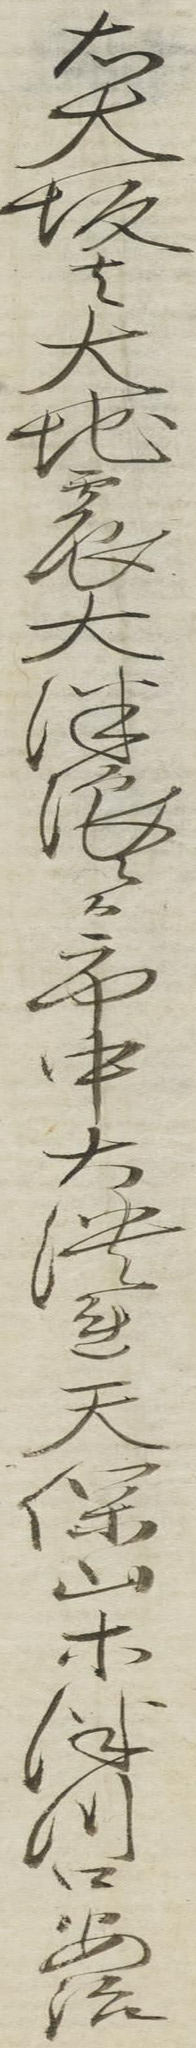右大坂は大地震大津浪ニ而市中大潰れ天保山等津川口安治
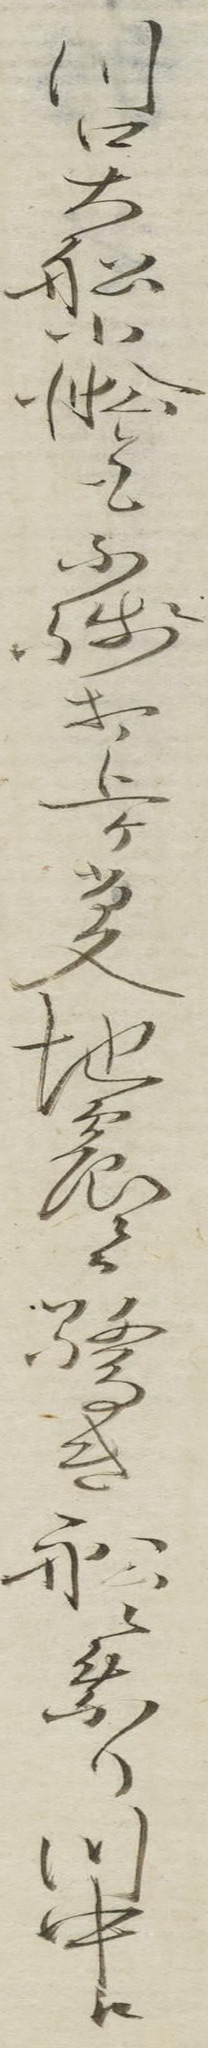川口大船小船とも不残打上ケ尚又地震ニ而驚き船ニ乗り川中江
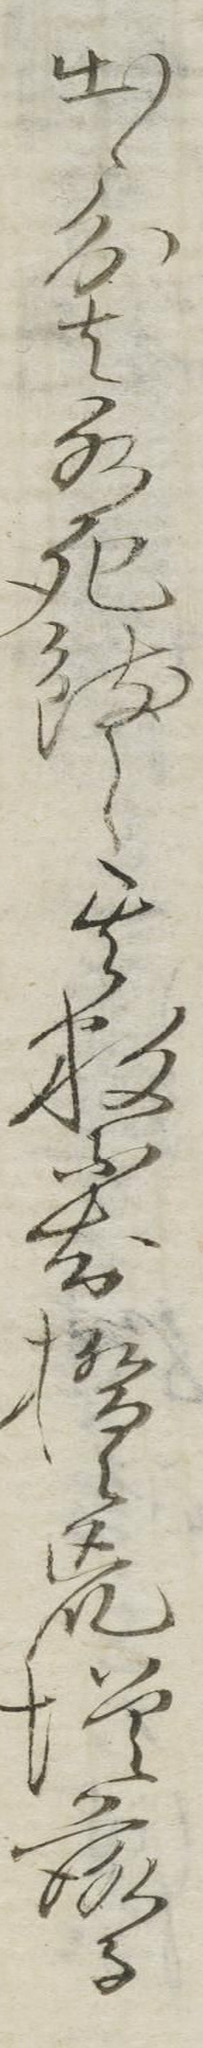出し分は水死致し其数不知橋〻荒増落る
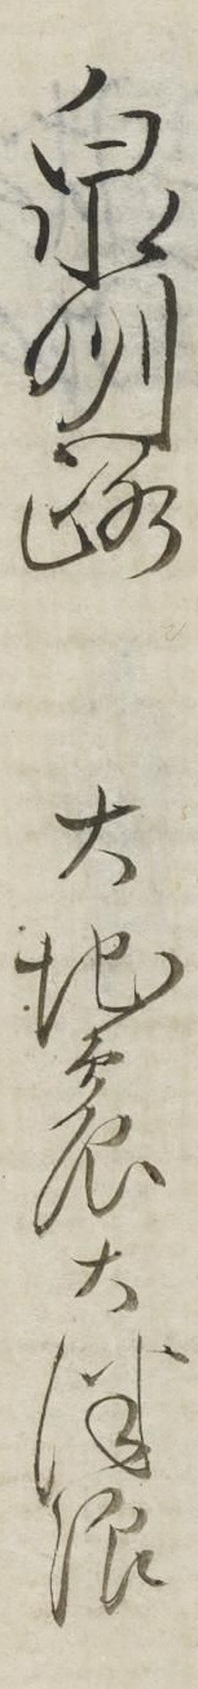泉州路大地震大津浪
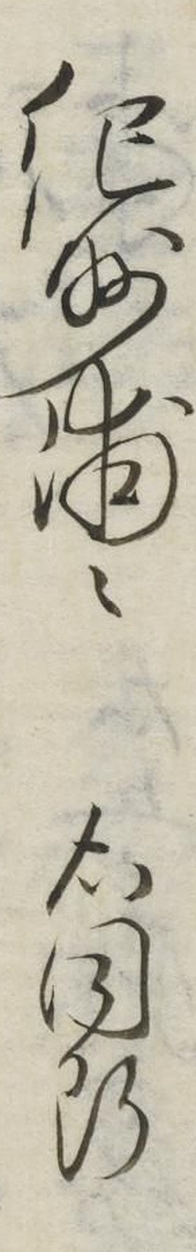紀州浦〻右同断
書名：大地震實録
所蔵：東京大学地震研究所図書室 Earthquake Research Institute Library, The University of Tokyo, JAPAN
